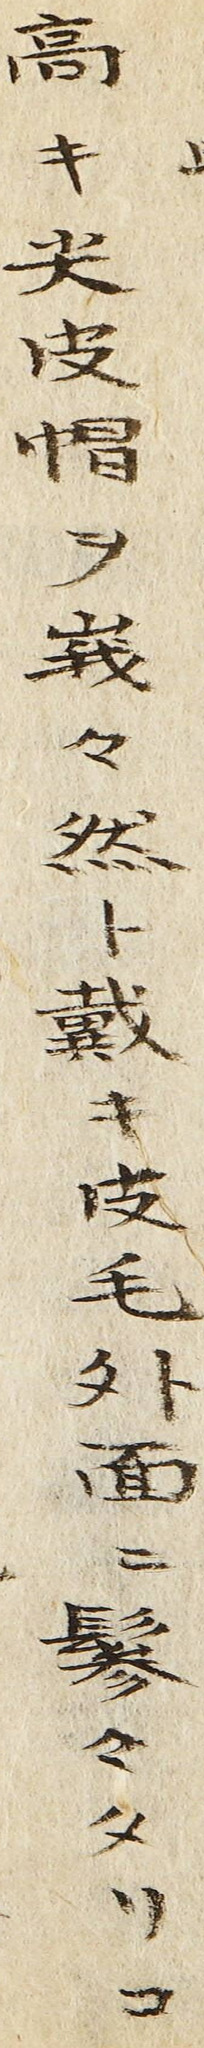高キ尖皮帽ヲ峨々然ト戴キ皮毛外面ニ鬖々タリコ
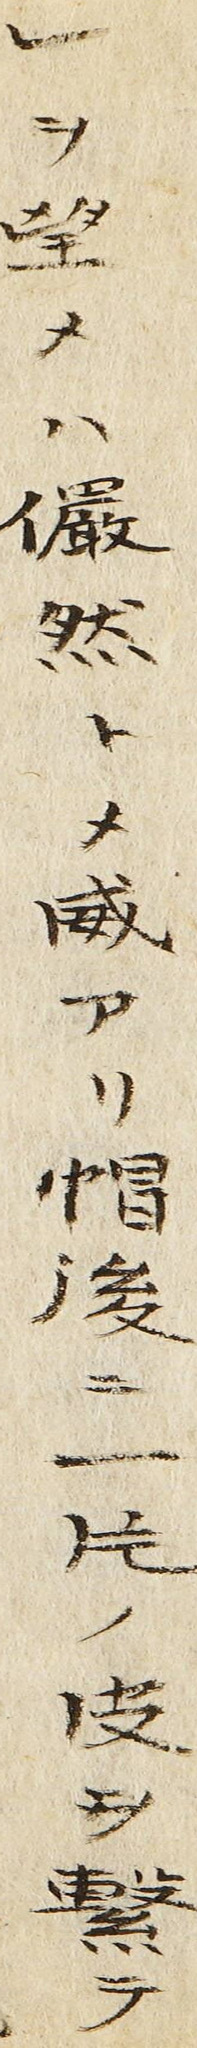レヲ望メハ儼然トシテ威アリ帽後ニ一片ノ皮ヲ繋テ
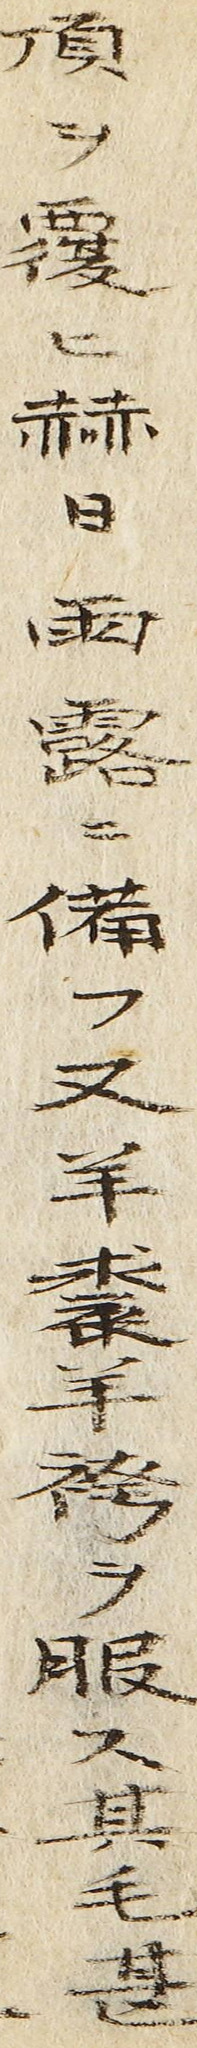頂ヲ覆ヒ赫日雨露ニ備フ又羊裘羊袴ヲ服ス其毛甚
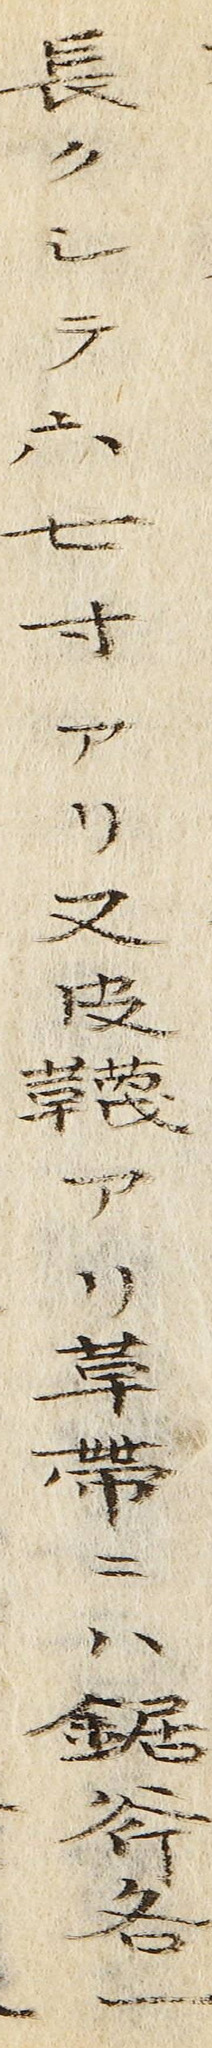長クシテ六七寸アリ又皮韈アリ革帯ニハ鋸斧各一
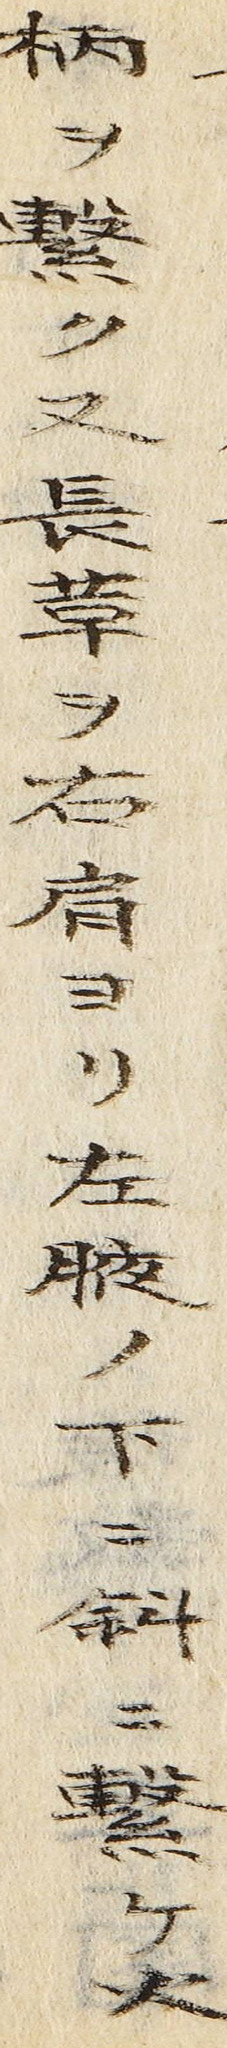柄ヲ繋ク又長革ヲ右肩ヨリ左腋ノ下ニ斜ニ繋ケ火
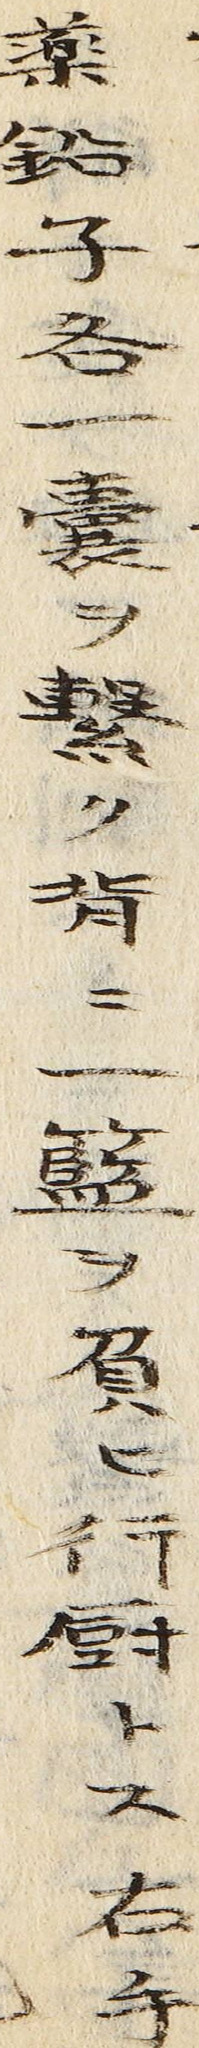薬鉛子各一嚢ヲ繋ク背ニ一籃ヲ負ヒ行厨トス右手
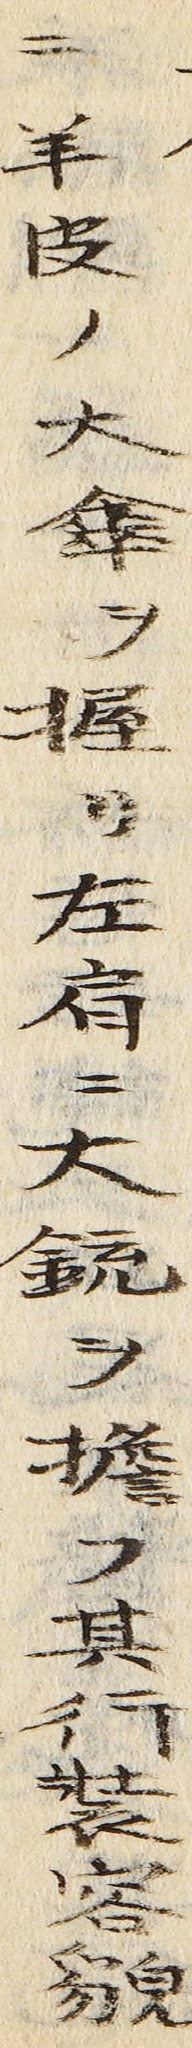ニ羊皮ノ大傘ヲ握リ左肩ニ大銃ヲ担フ其行装容貌
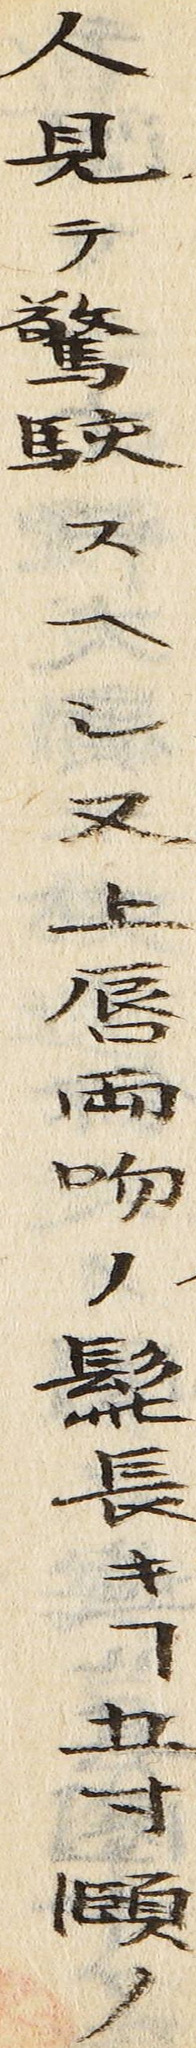人見テ驚駭スヘシ又上唇両吻ノ髭長キコト五寸頤ノ
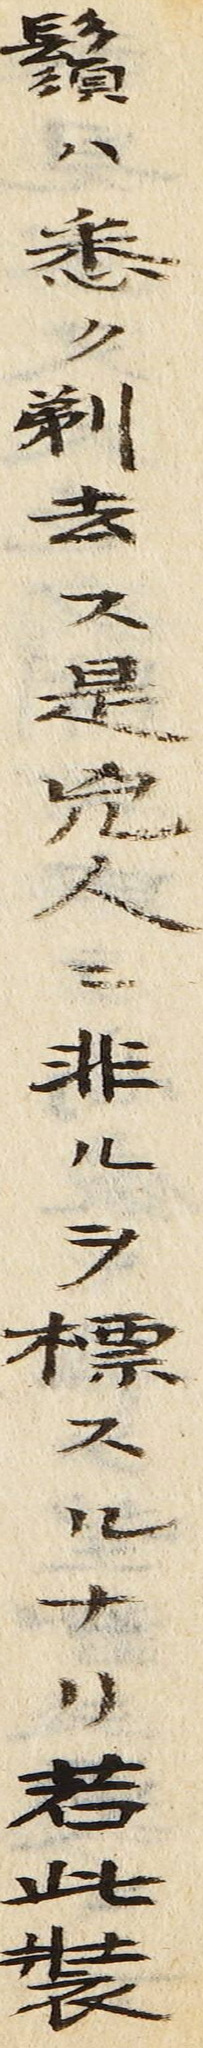鬚ハ悉ク剃去ス是兇人ニ非ルヲ標スルナリ若此装
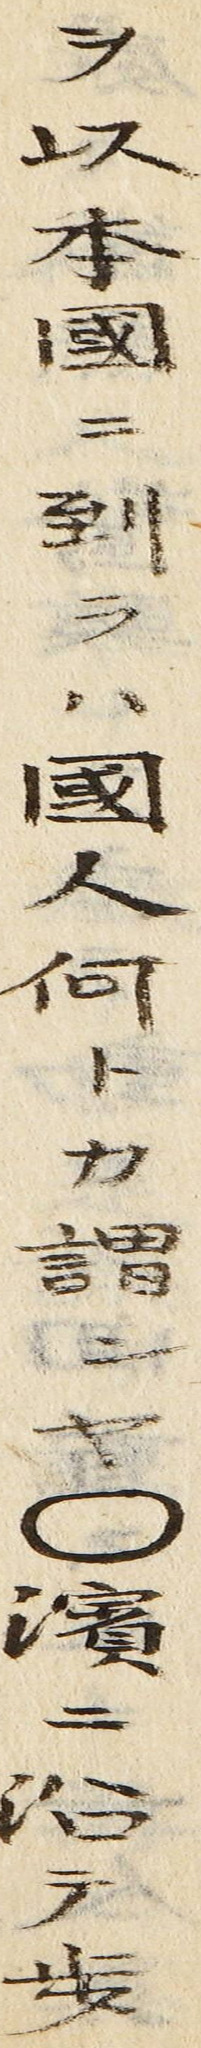ヲ以本国ニ到ラハ国人何トカ謂ンヤ◯浜ニ沿テ歩
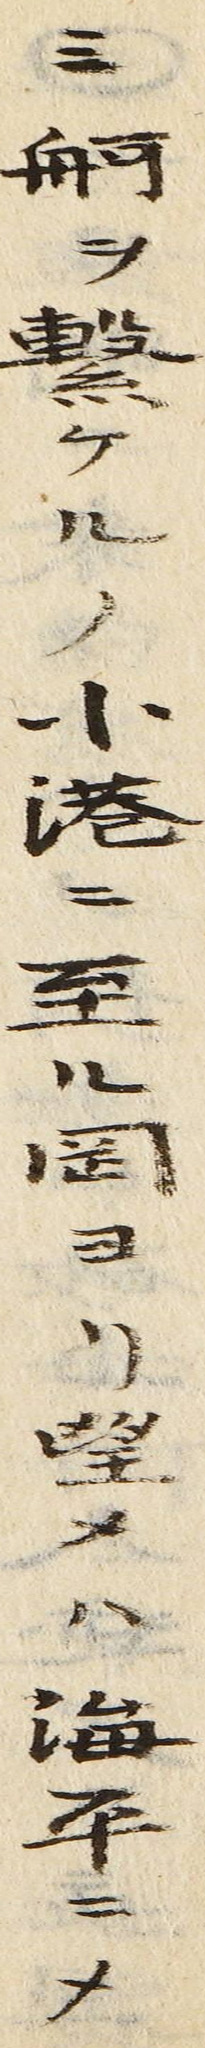ミ舸ヲ繋ケルノ小港ニ至ル岡ヨリ望メハ海平ニシテ
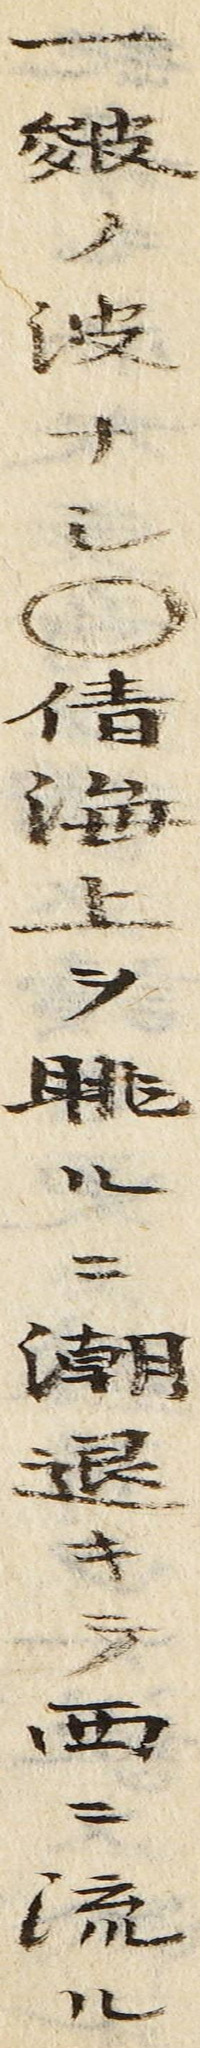一皴ノ波ナシ◯倩海上ヲ眺ルニ潮退キテ西ニ流ル
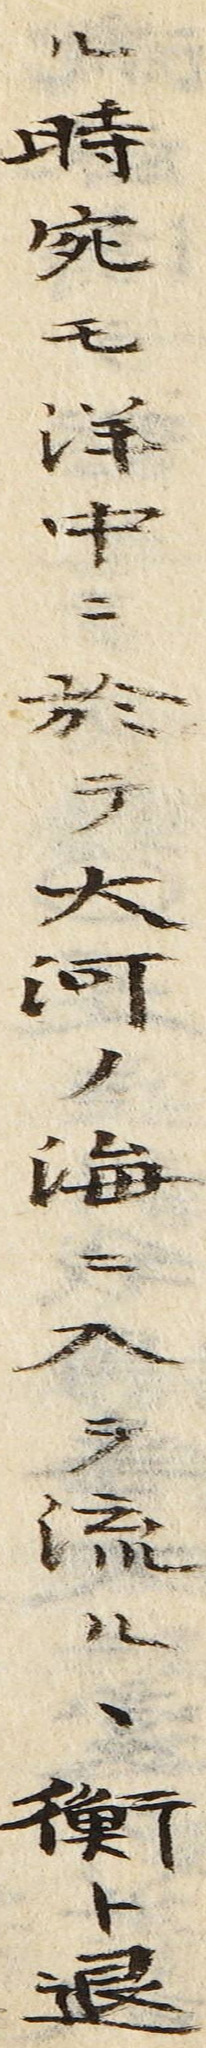ル時宛モ洋中ニ於テ大河ノ海ニ入テ流ルヽ衡ト退
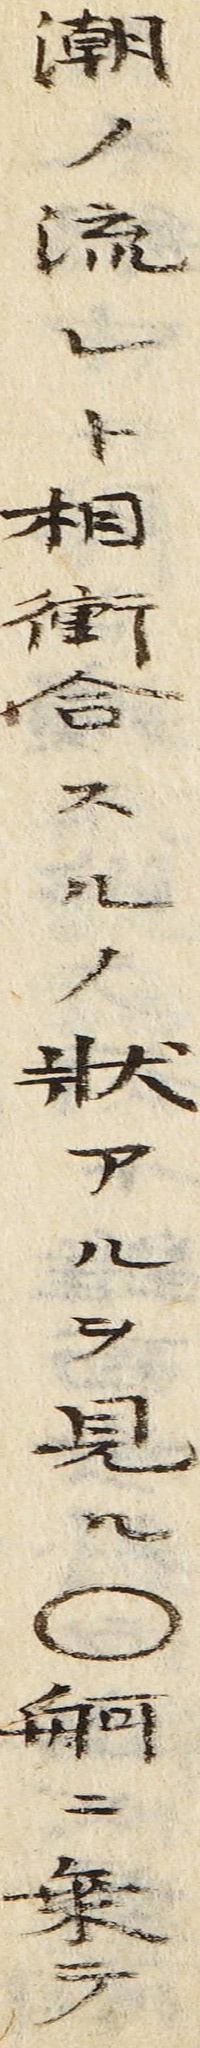潮ノ流レト相衝合スルノ状アルヲ見ル◯舸ニ乗テ
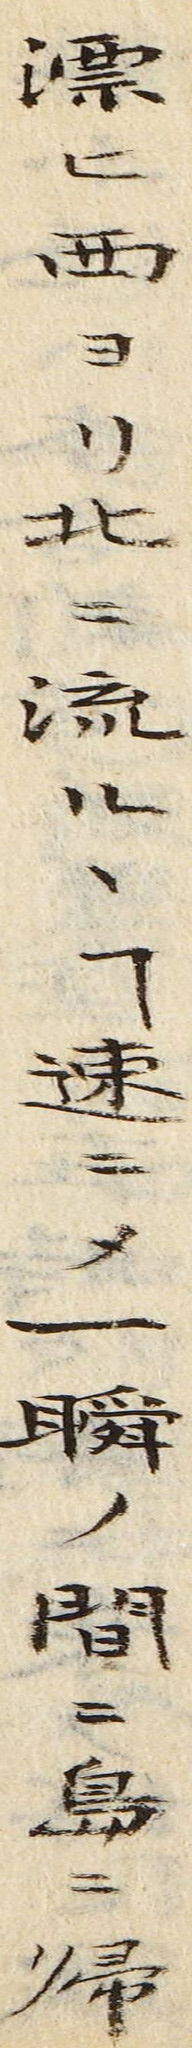漂ヒ西ヨリ北ニ流ルヽコト速ニシテ一瞬ノ間ニ島ニ帰
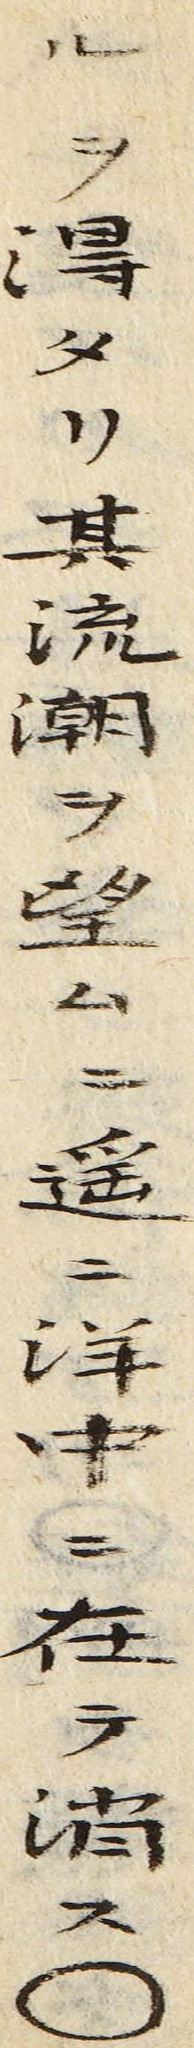ルヲ得タリ其流潮ヲ望ムニ遥ニ洋中ニ在テ消ス◯
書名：漂流紀事
